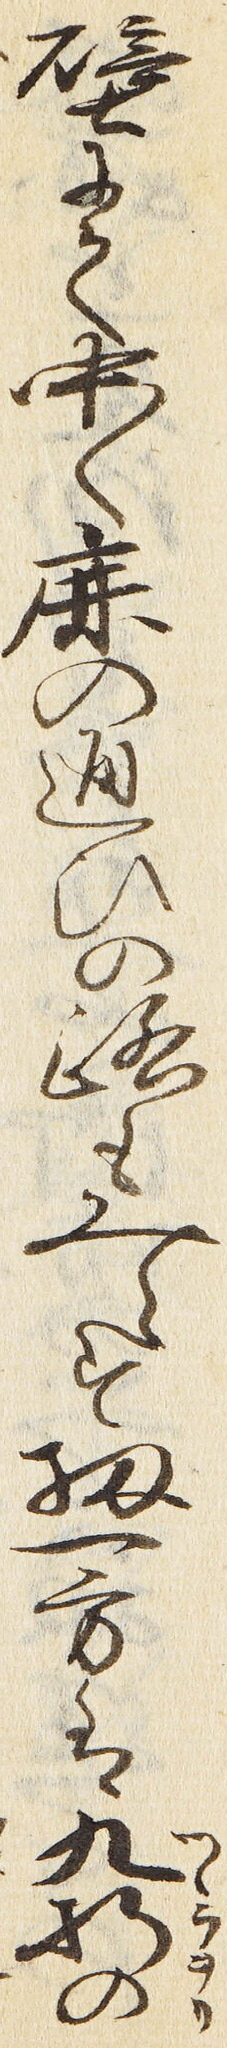壁にて中〳〵鹿の通ひの路もみえす扨一方は九折の
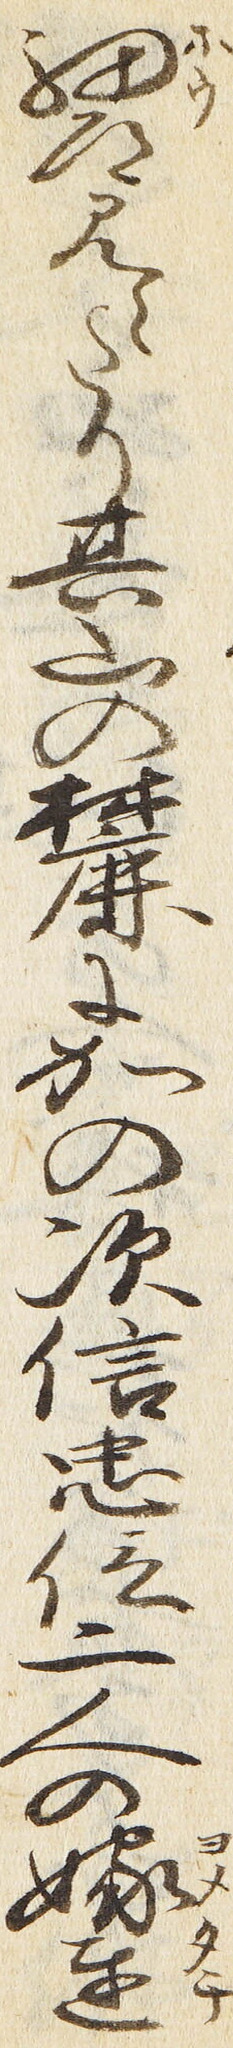細道見えたり其山の麓にかの次信忠信二人の嫁達
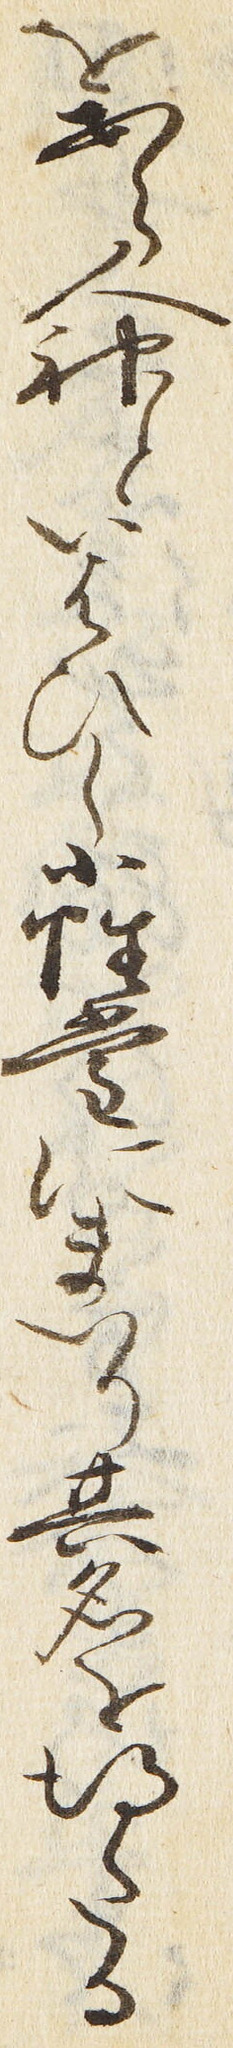をあら人神といはひし小性堂にまいり其名を得たる
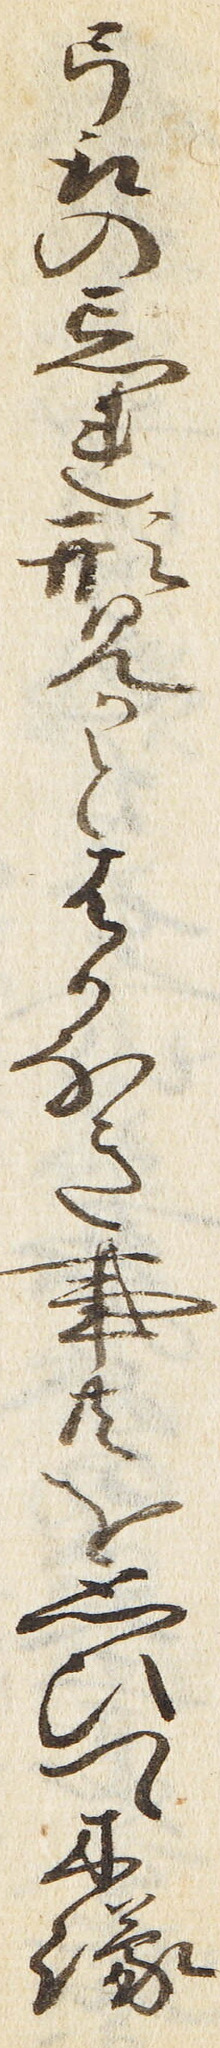弓取の忘れ形見かとはかなき事共を思ひて木像
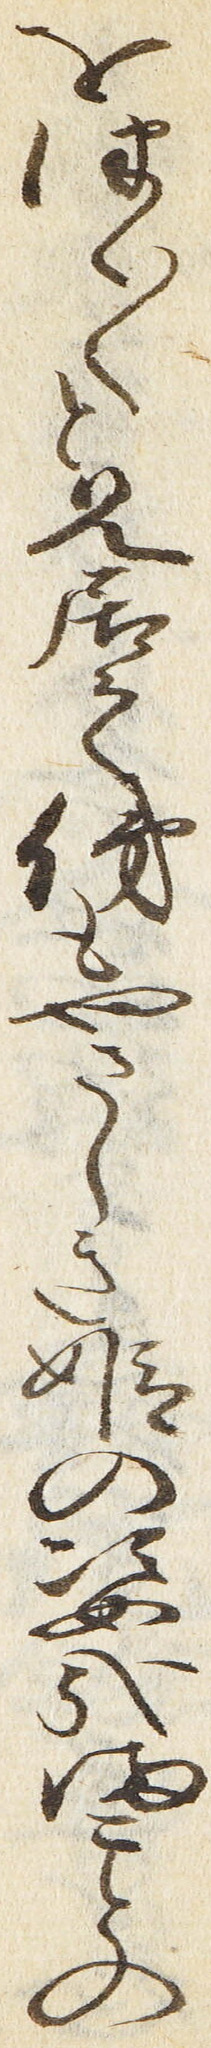をつく〳〵と見居て俤もやさしき姫の姿哉まことの
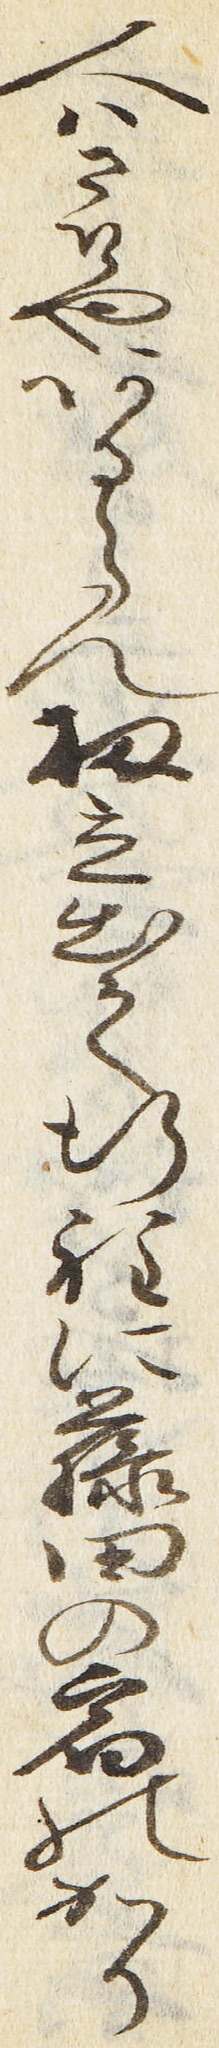人はさそやあるらん扨立出て行程に藤田の宿のかり
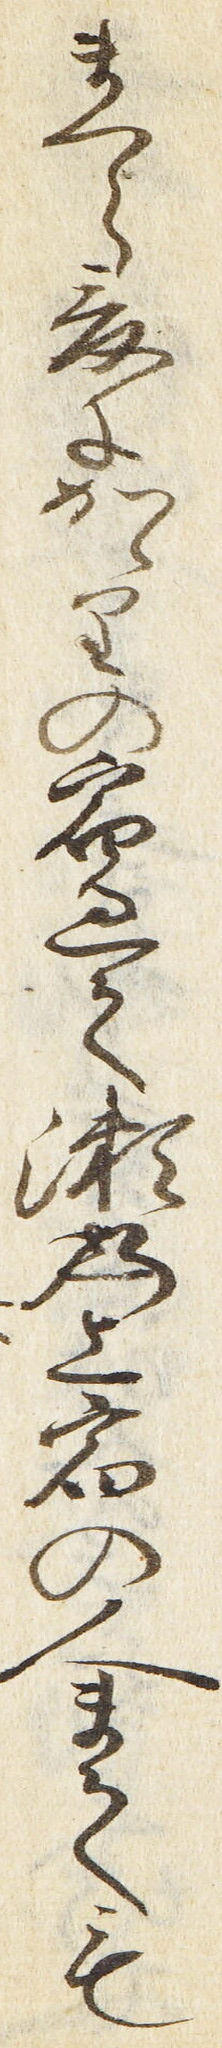まくら爰にかゝりの宿過て瀬の上宿の人まても
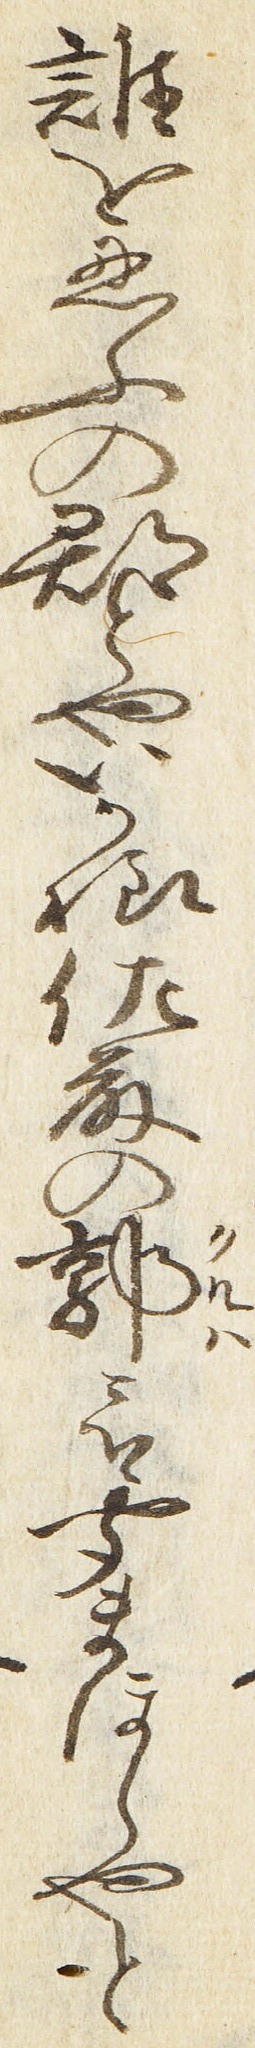誰を忍ふの郡とやいか様佐藤の郭こそ聞まほしやと
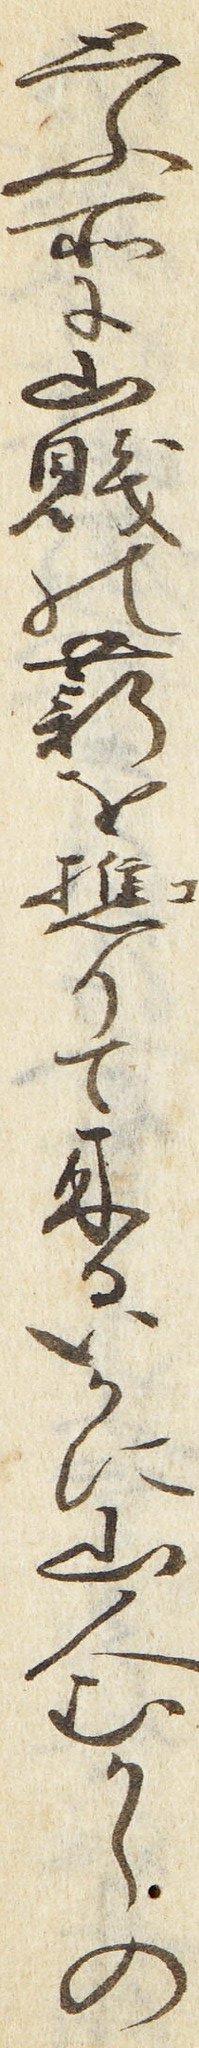思ふ所に山賎の薪を樵りて来るいかに山人むかしの

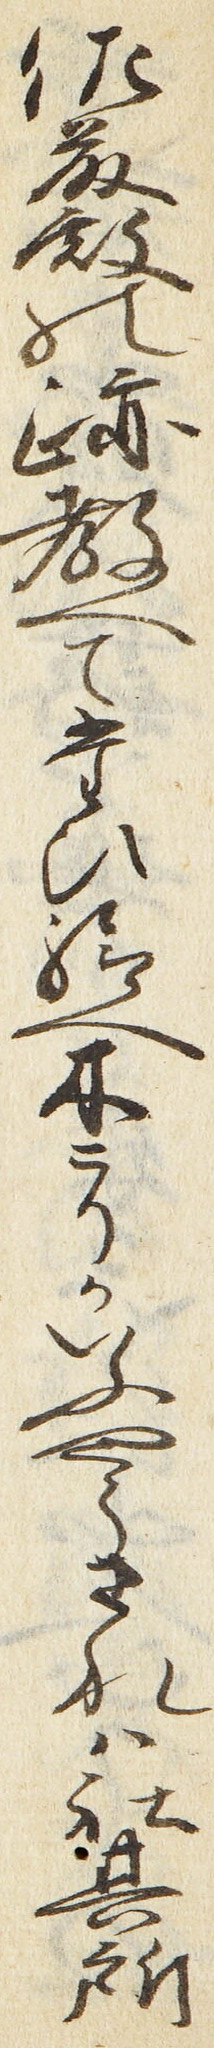佐藤殿の跡教へてたひ給へ木こりかいふやうされは社其所
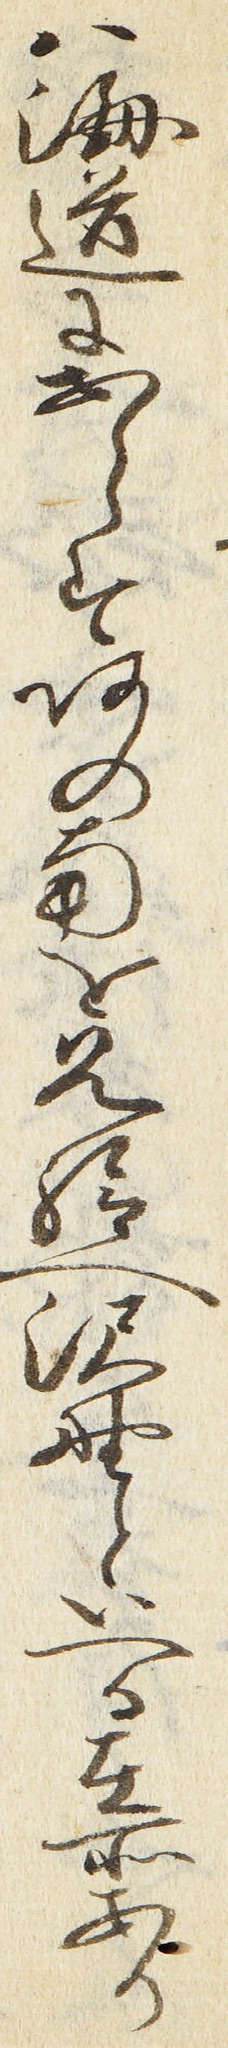は海道にあらすあの南を見給へ沢野といへる在所あり
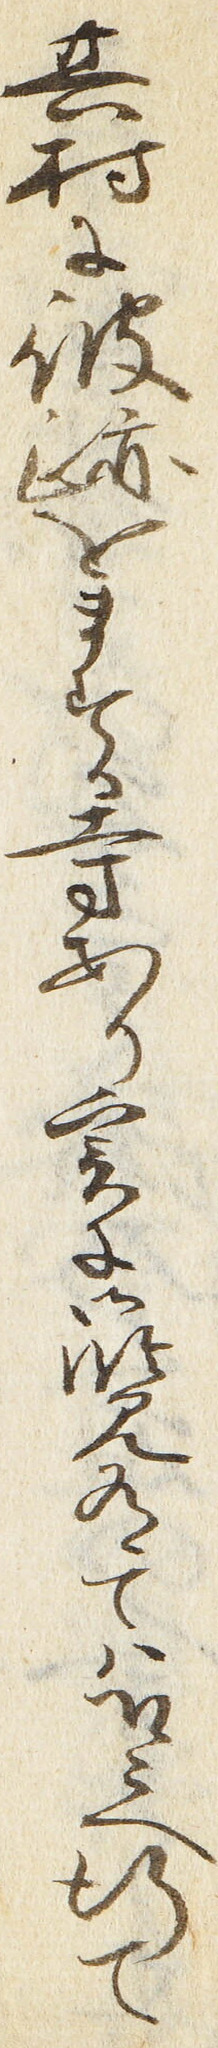其村に彼跡をまする寺あり実に御覧有てはそこへ行て
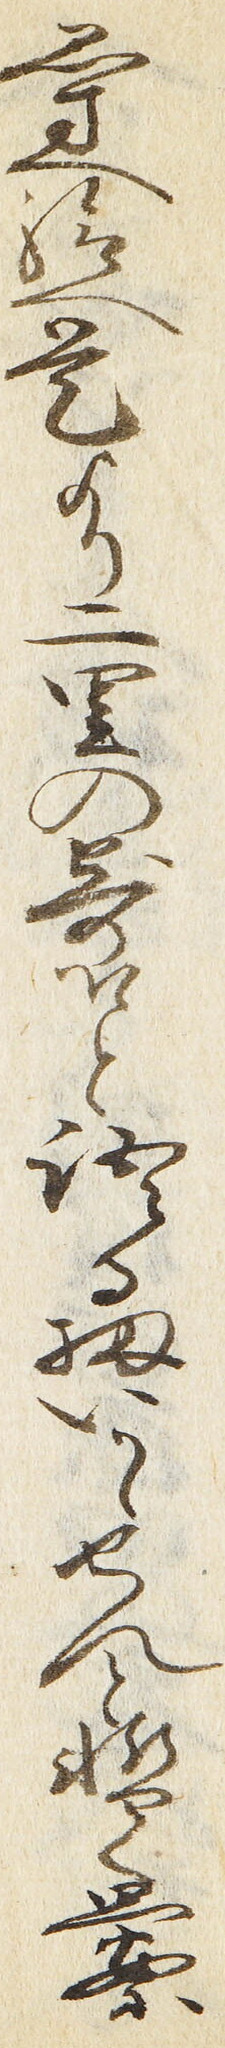尋へ給へ是より二里の寄そと語る扨いかゝせんと暫く思案
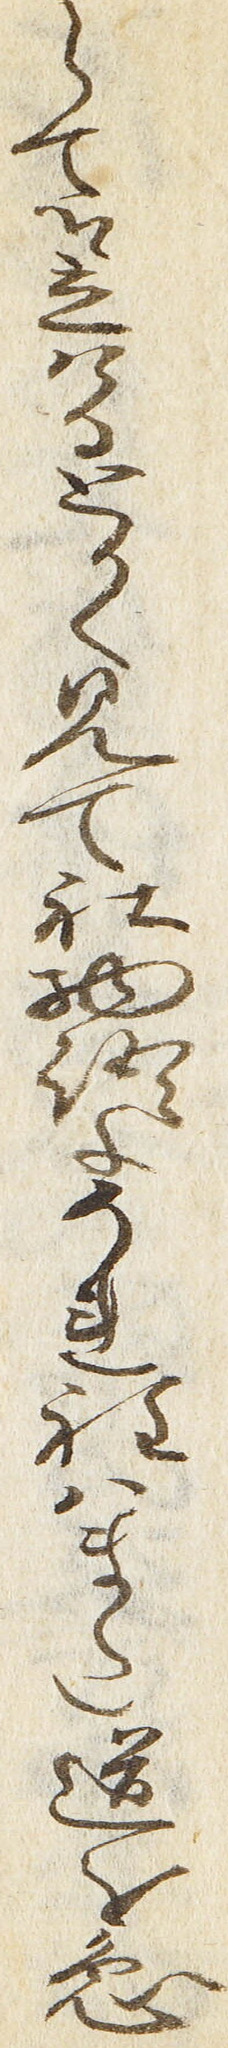してそ立けるとかく見て社物語よそれ程はまた道を急
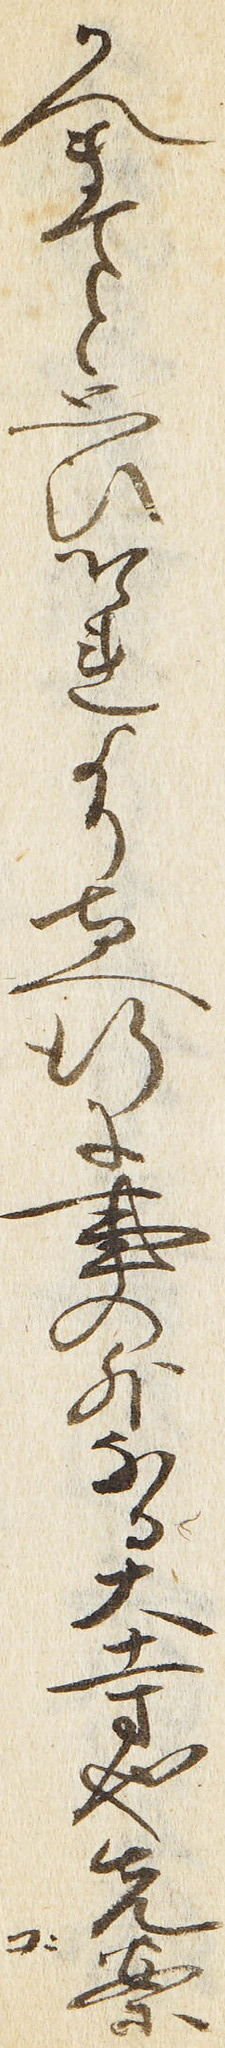かんまてと思ひそれより寺へ行に事の外なる大寺や先案
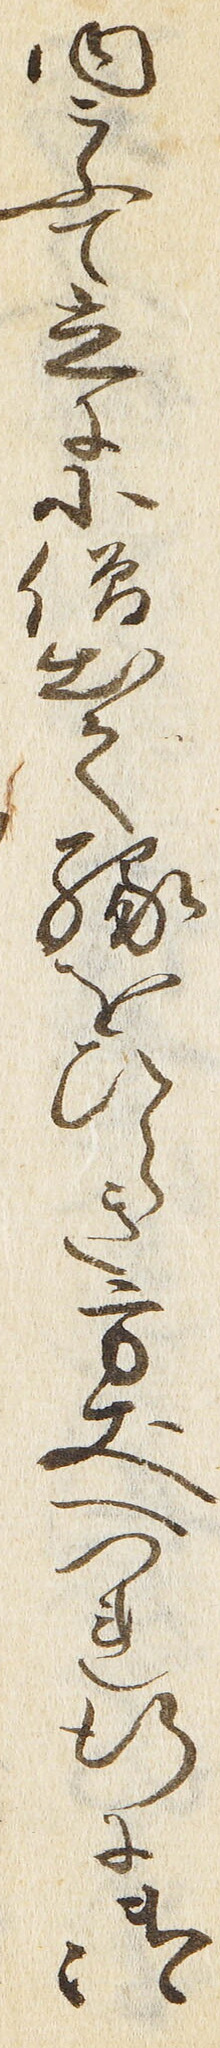内こふて立に小僧出て縁をひらき方丈へつれ行に御
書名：海陸世話日記
